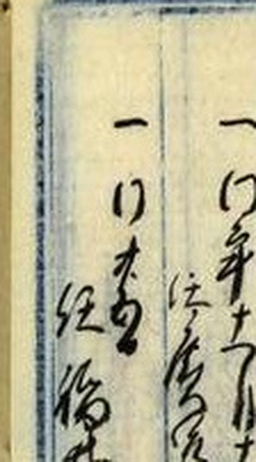一同廿五日
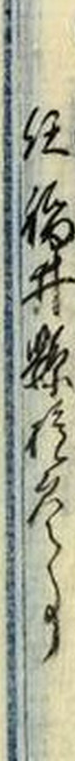任福井県権参事
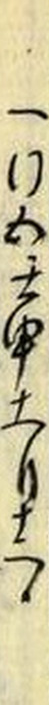一同五壬申十一月十二日
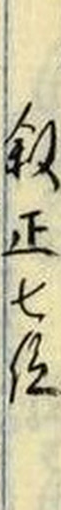叙正七位
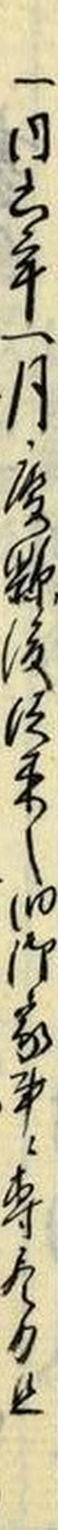一同六年一月渡県後従来之旧御家中ニ専尽力且
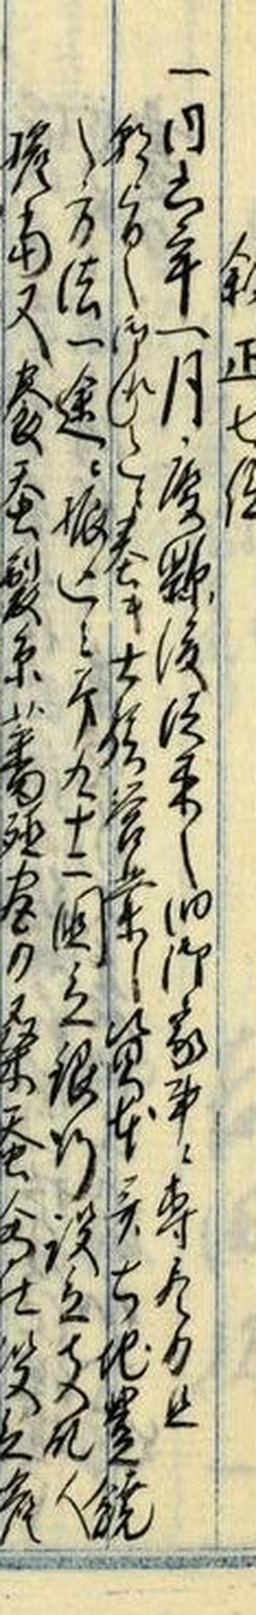朝旨之御趣意ニ基キ士族営業之資本并土地豊饒
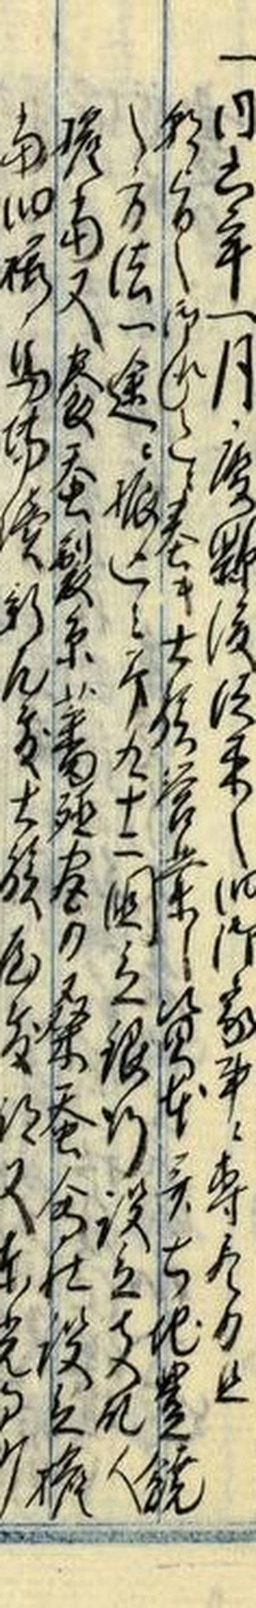之方法一途ニ振込ミ第九十二国立銀行設立支配人
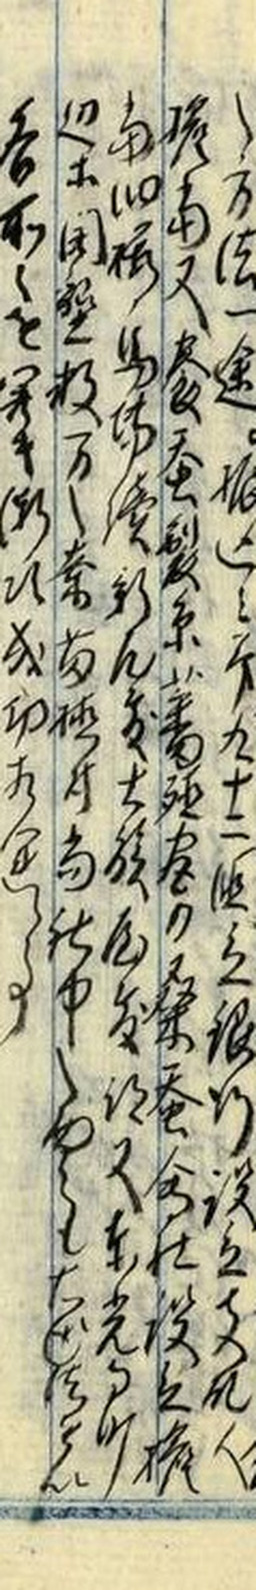当旧桜馬場続新屋敷士族屋敷跡又東光寺町
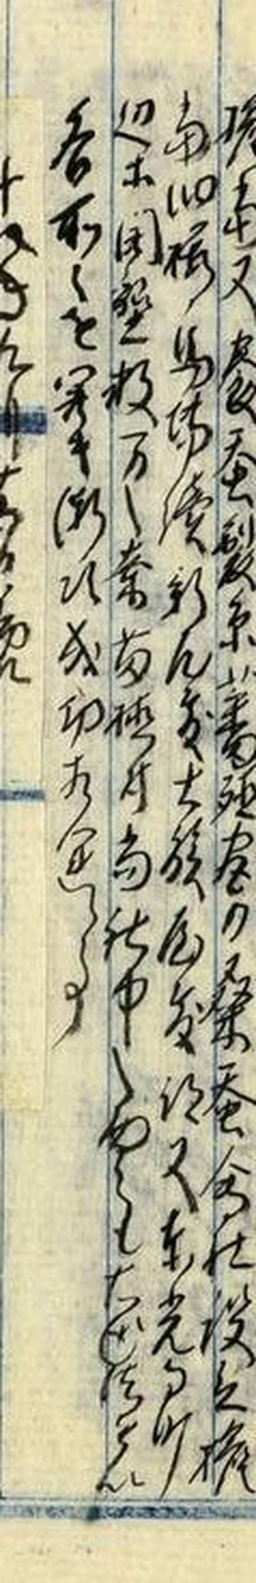辺等開墾数万之桑苗植付当社中之面々も右趣法を以
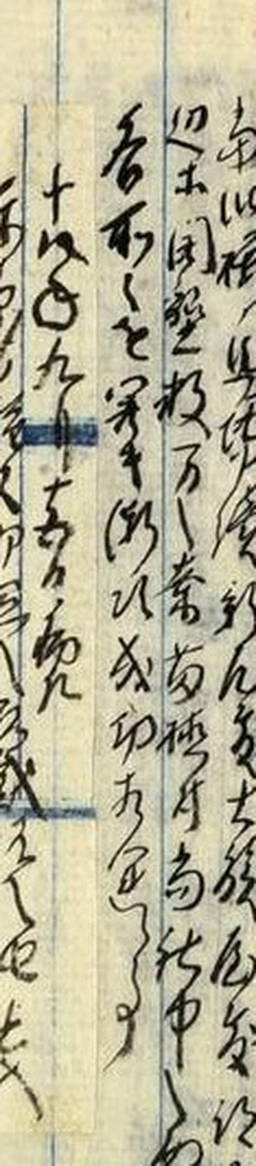各所々を開キ漸次成功相企候事
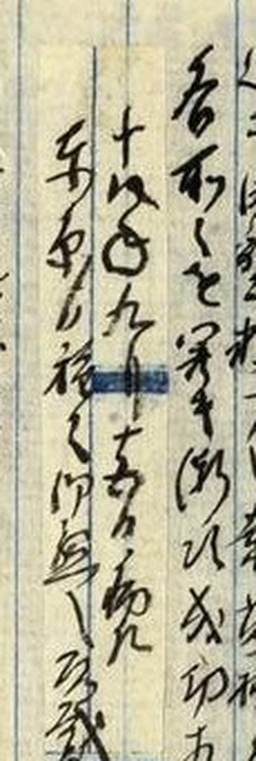十八年九月十五日病死
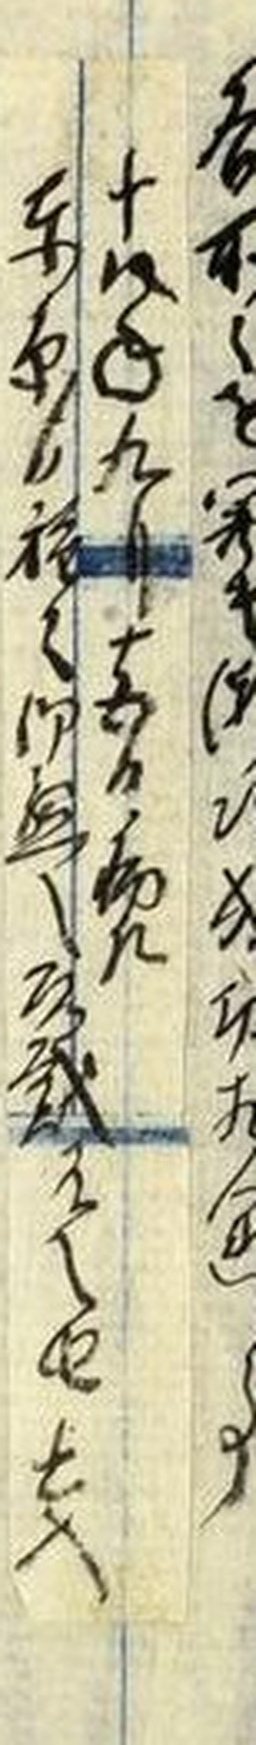東京ゟ種々御恵之頂戴有之由書入
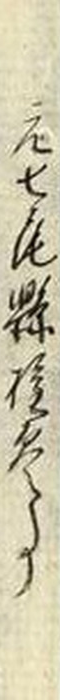元足羽県権参事
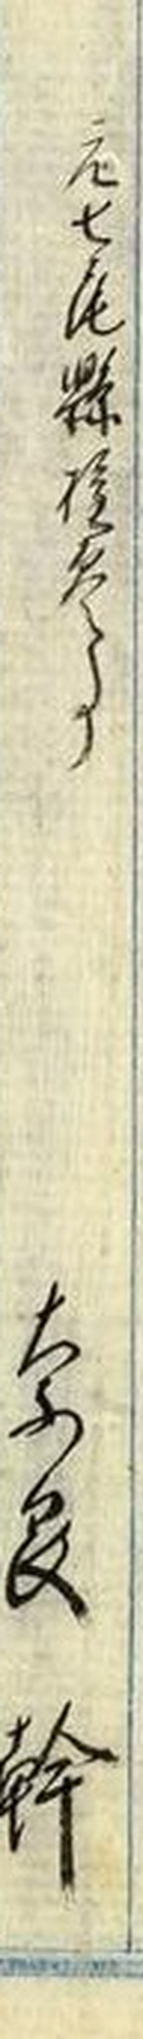元七尾県権参事奈良幹
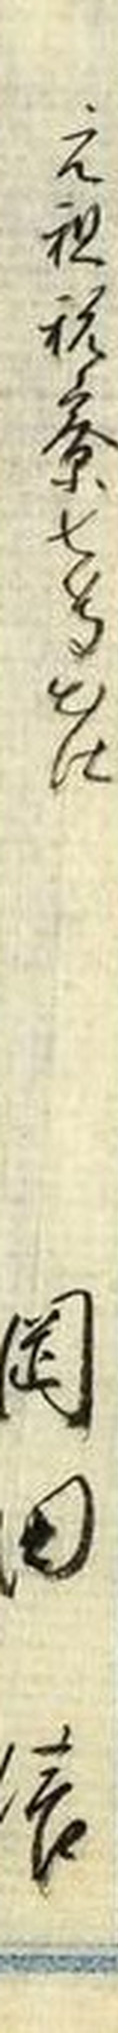元租税寮七等出仕岡田信
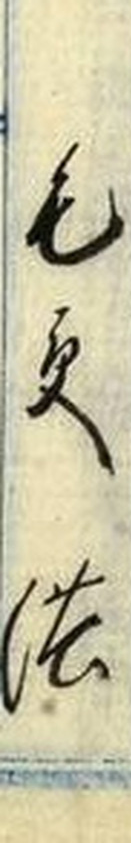毛受洪
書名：温古集 三巻
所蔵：福井県文書館 Fukui Prefectural Archives
